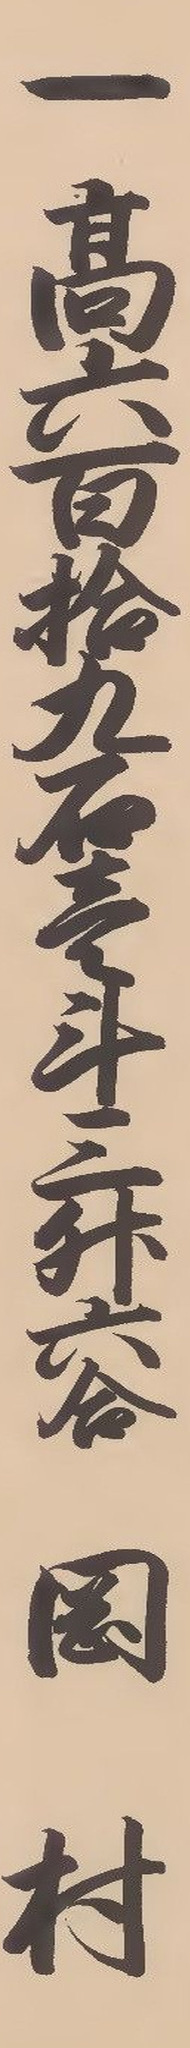一高六百拾九石壱斗三升六合岡村
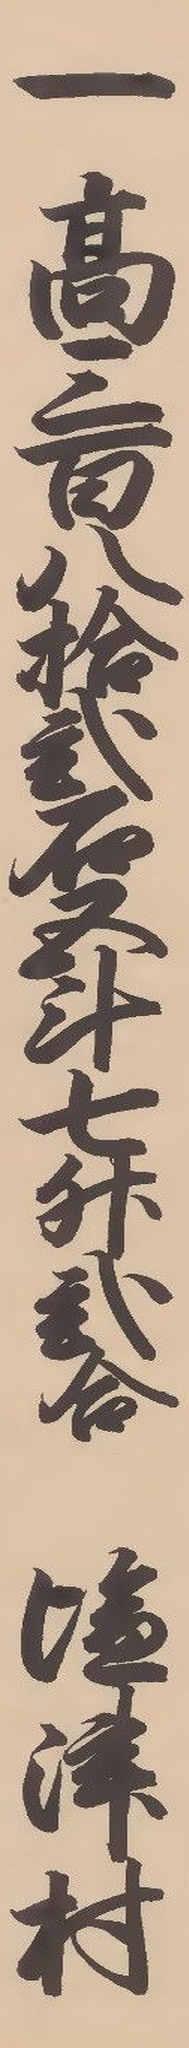一高三百八拾弐石五斗七升弐合塩津村
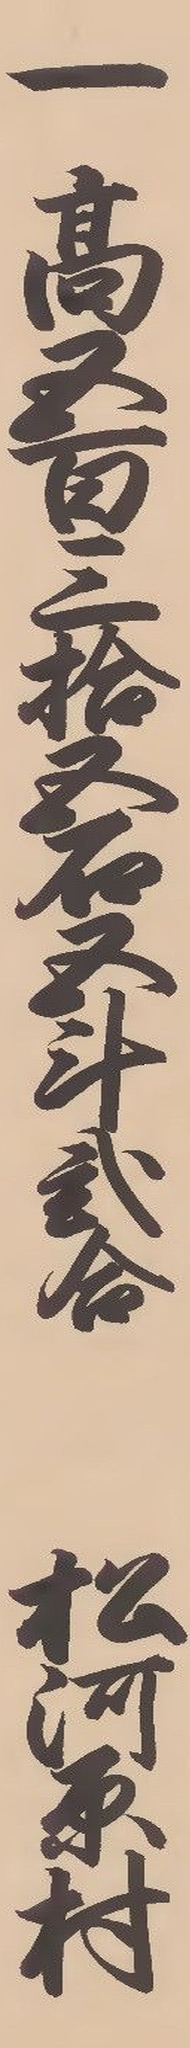一高五百三拾五石五斗弐合松河原村
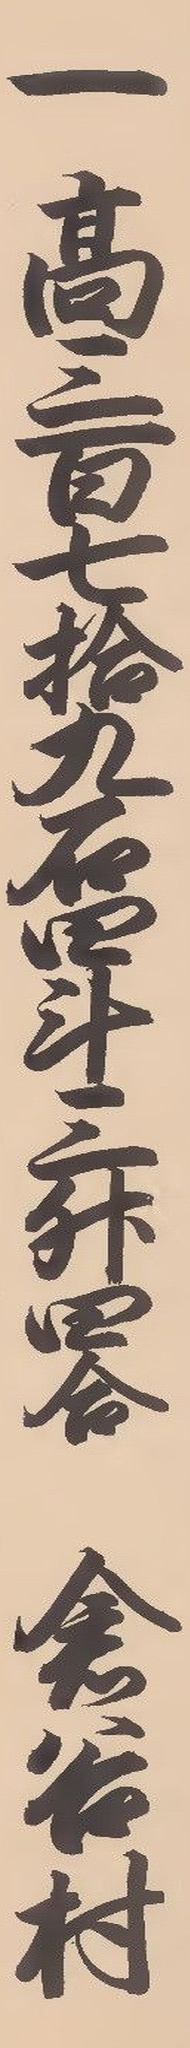一高三百七拾九石四斗三升四合倉谷村
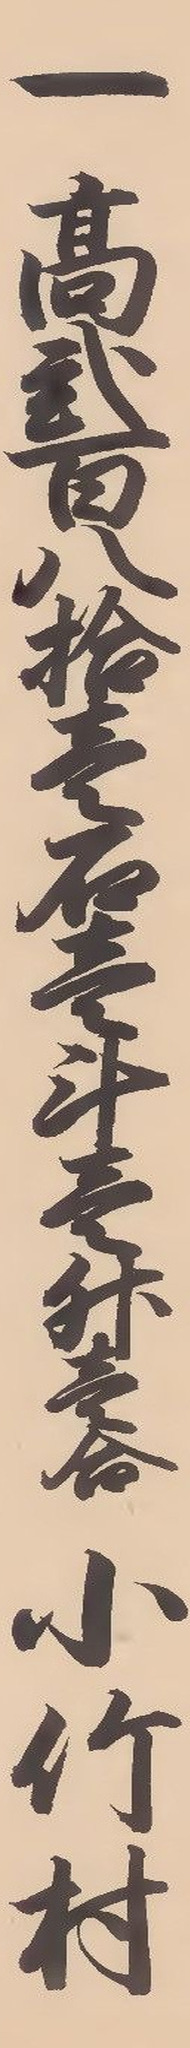一高弐百八拾壱石壱斗壱升壱合小竹村
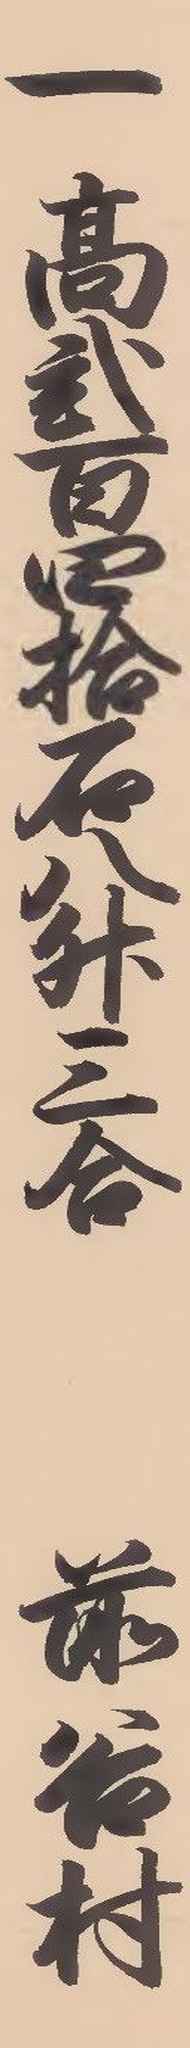一高弐百四拾石八升三合前谷村
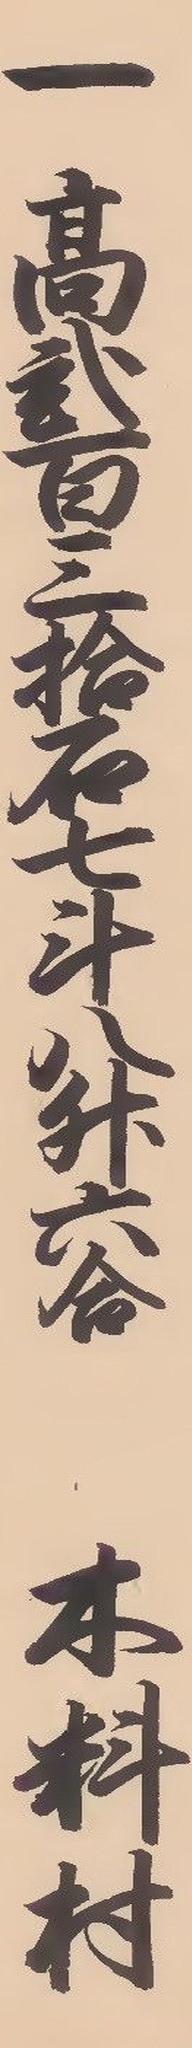一高弐百三拾石七斗八升六合木料村

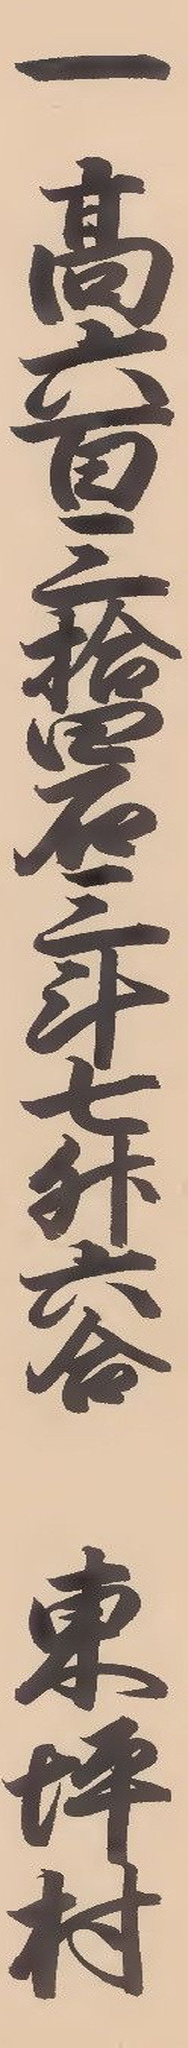一高六百三拾四石三斗七升六合東坪村
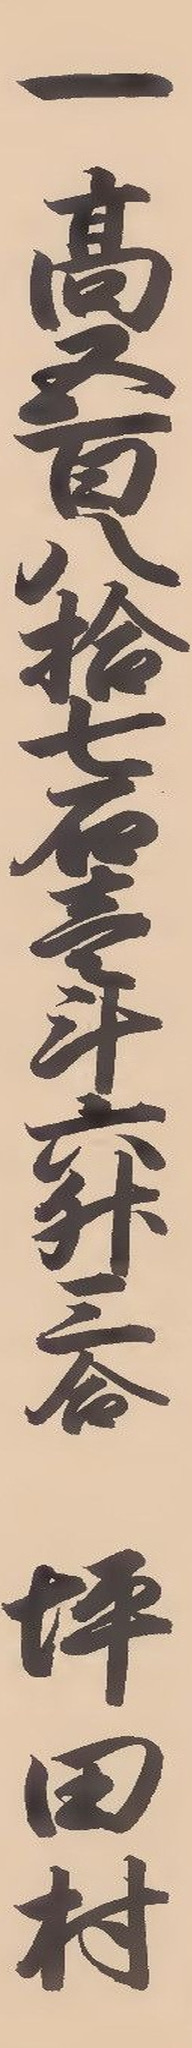一高五百八拾七石壱斗六升三合坪田村
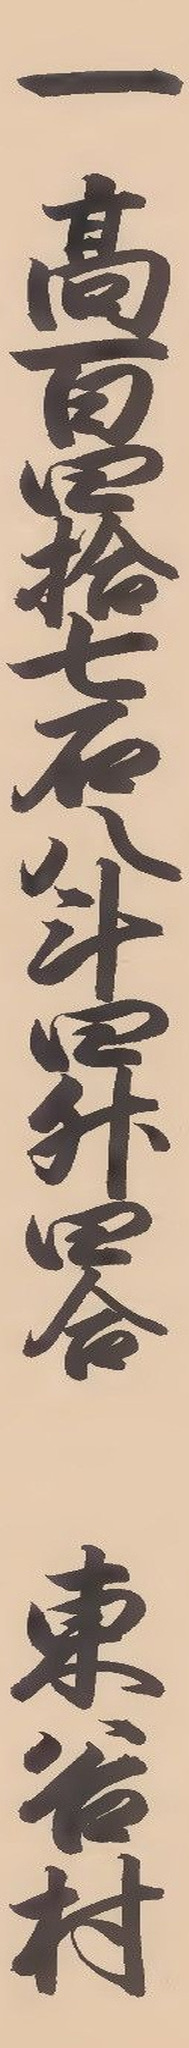一高百四拾七石八斗四升四合東谷村
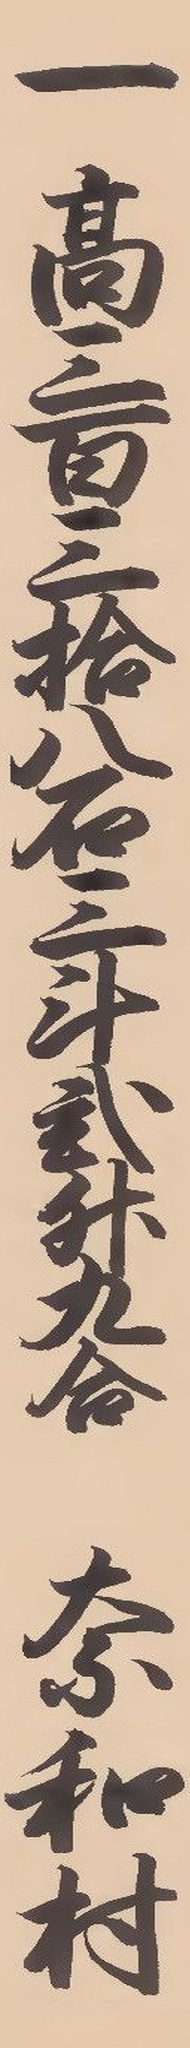一高三百三拾八石三斗弐升九合奈和村
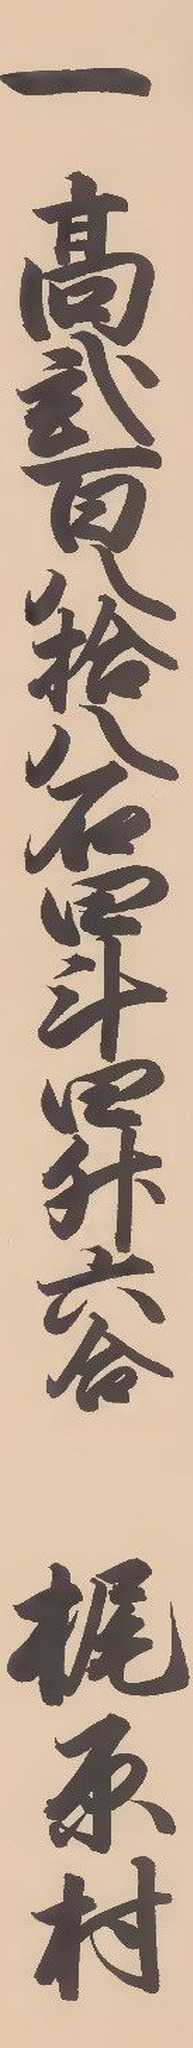一高弐百八拾八石四斗四升六合梶原村
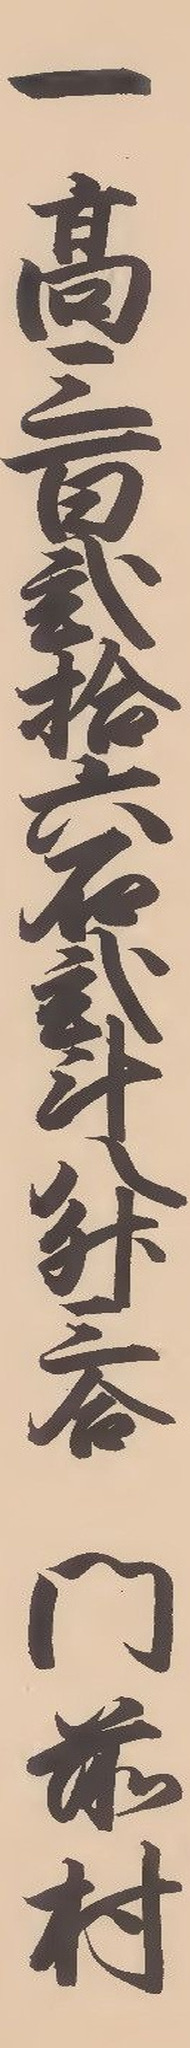一高三百弐拾六石弐斗八升三合門前村
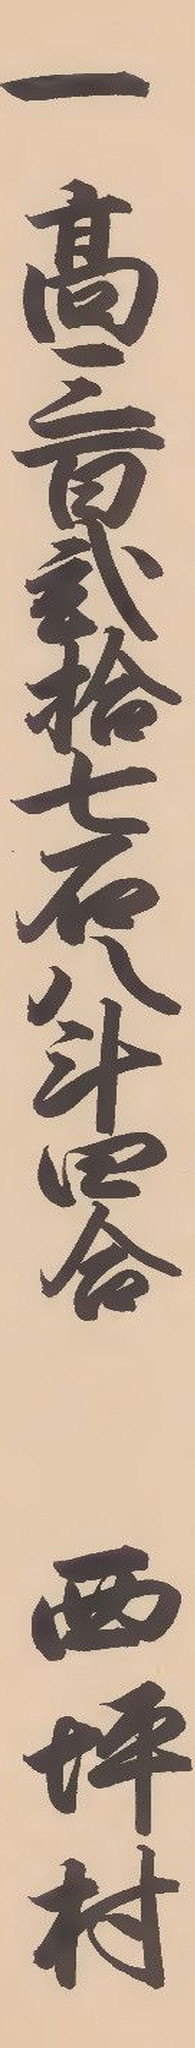一高三百弐拾七石八斗四合西坪村
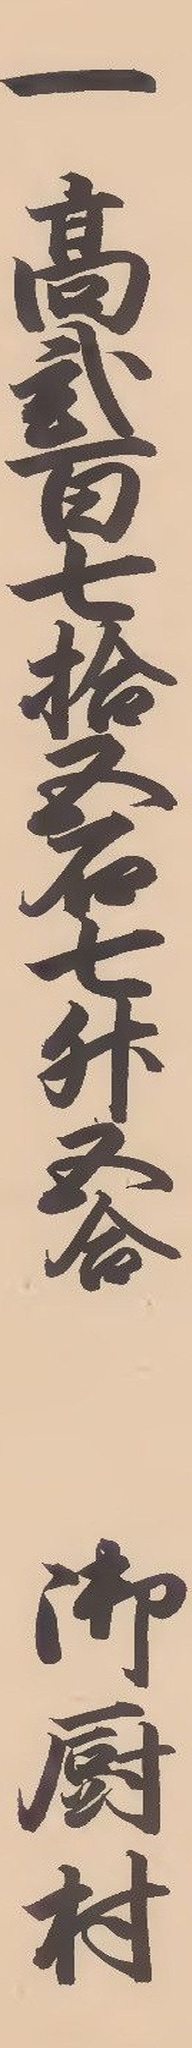一高弐百七拾五石七升五合御厨村

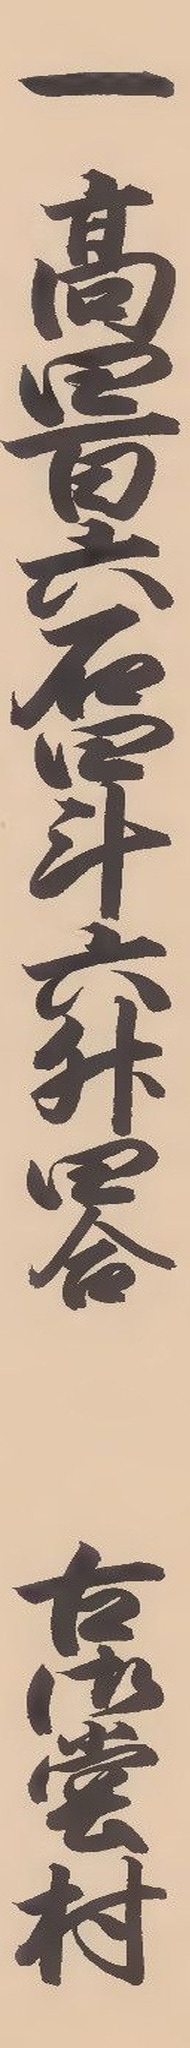一高四百六石四斗六升四合古御堂村
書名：伯耆国郷帳
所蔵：国立公文書館 National Archives of Japan
